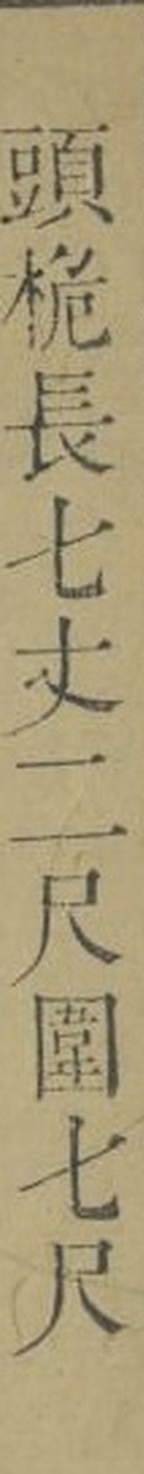頭桅長七丈二尺圍七尺
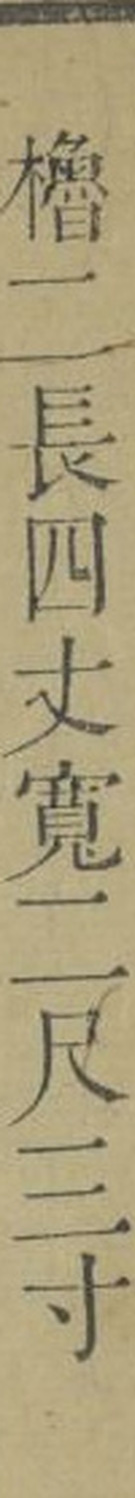櫓二長四丈寬二尺三寸
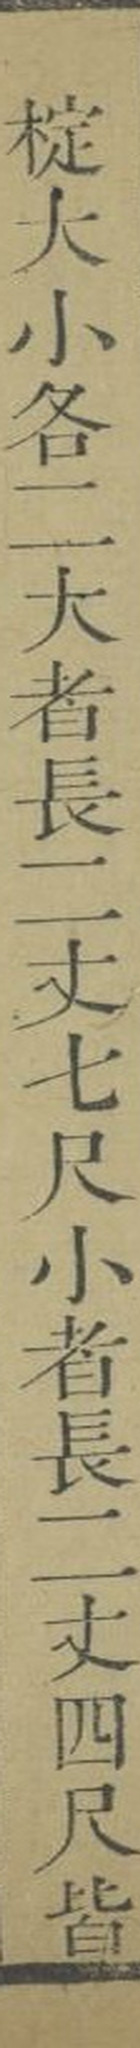椗大小各二大者長二丈七尺小者長二丈四尺皆
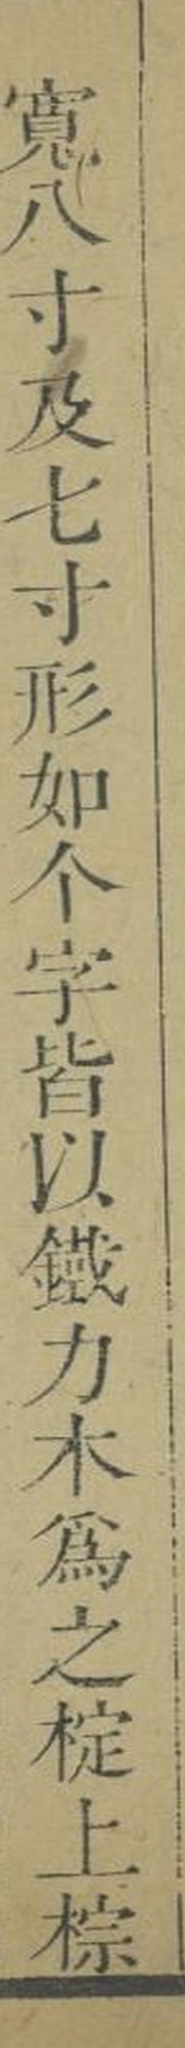寬八寸及七寸形如个字皆以鐵力木爲之椗上棕
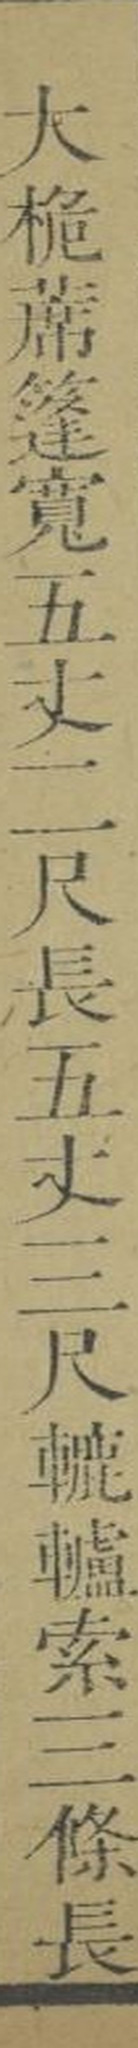大桅蓆篷寬五丈二尺長五丈三尺轆轤索三條長
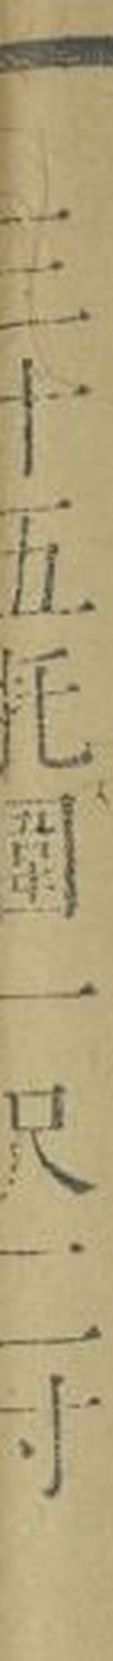三十五托圍一尺二寸
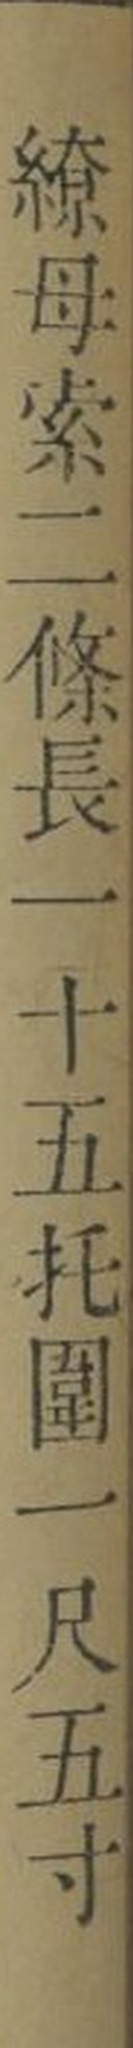繚母索二條長一十五托圍一尺五寸
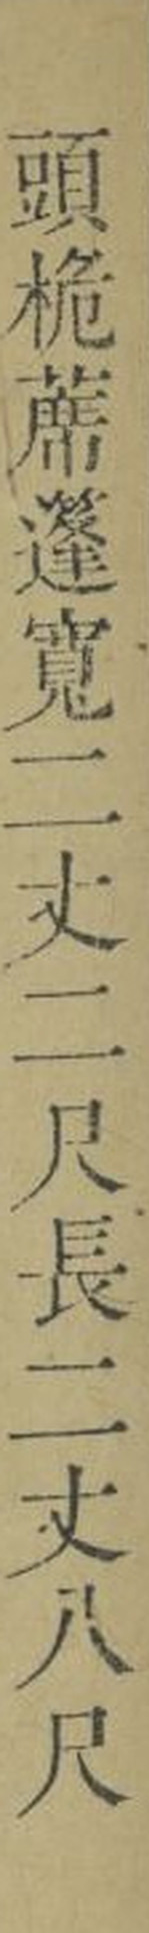頭桅蓆篷寬二丈二尺長二丈八尺
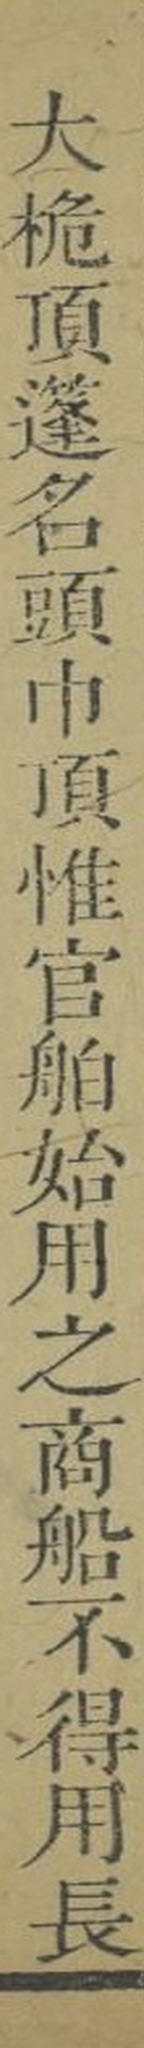大桅頂篷名頭巾頂惟官舶始用之商船不得用長
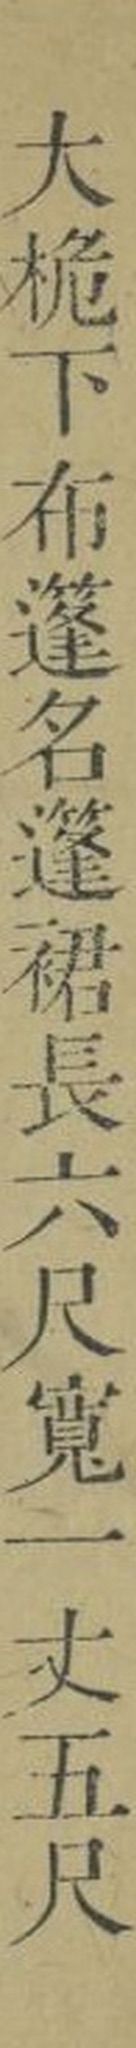大桅下布篷名篷裙長六尺寬一丈五尺
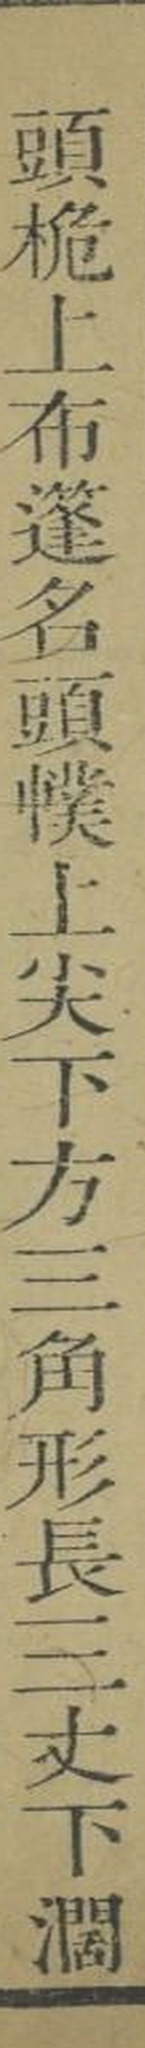頭桅上布篷名頭幞上尖下方三角形長三丈下濶
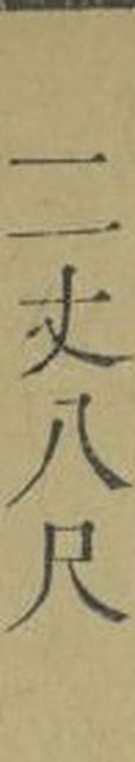二丈八尺
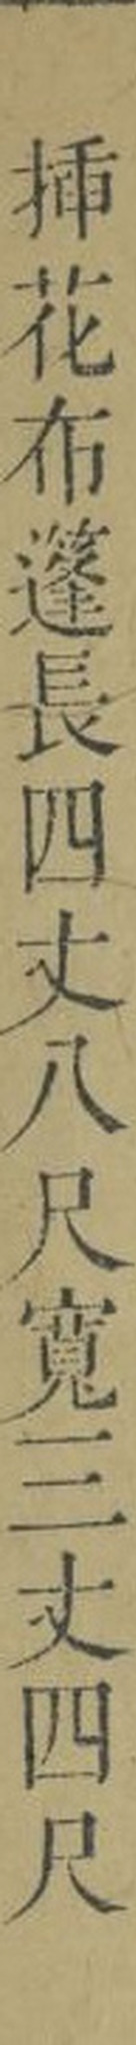揷花布篷長四丈八尺寬三丈四尺
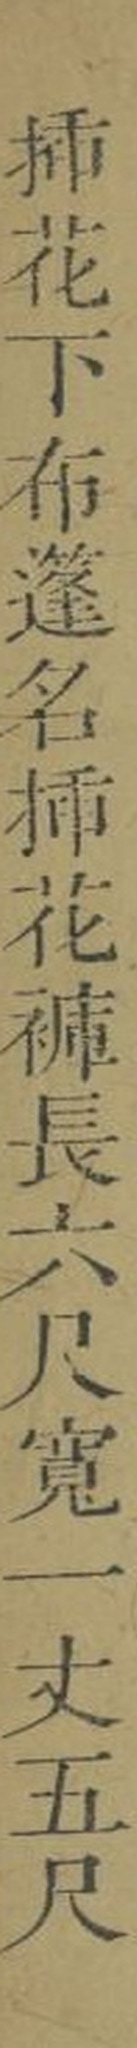揷花下布篷名揷花褲長六尺寬一丈五尺

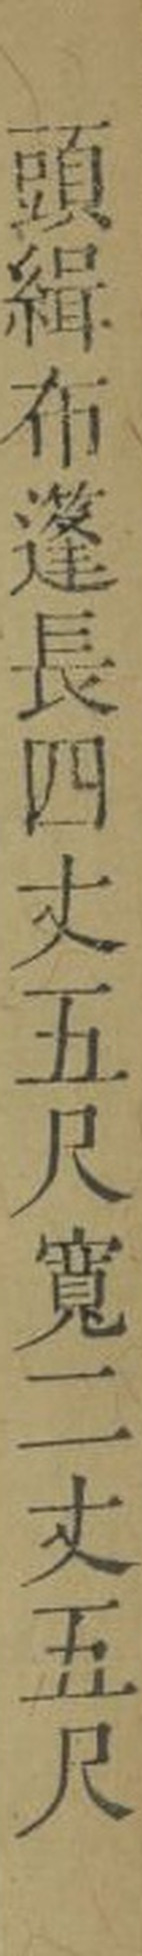頭緝布篷長四丈五尺寬二丈五尺
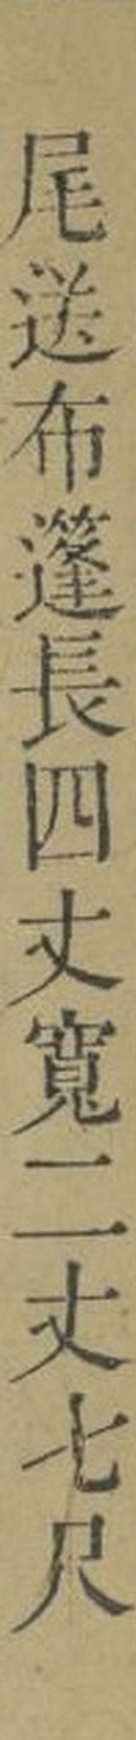尾送布篷長四丈寬二丈七尺
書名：中山伝信録 巻一
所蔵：University of the Ryukyus Library
